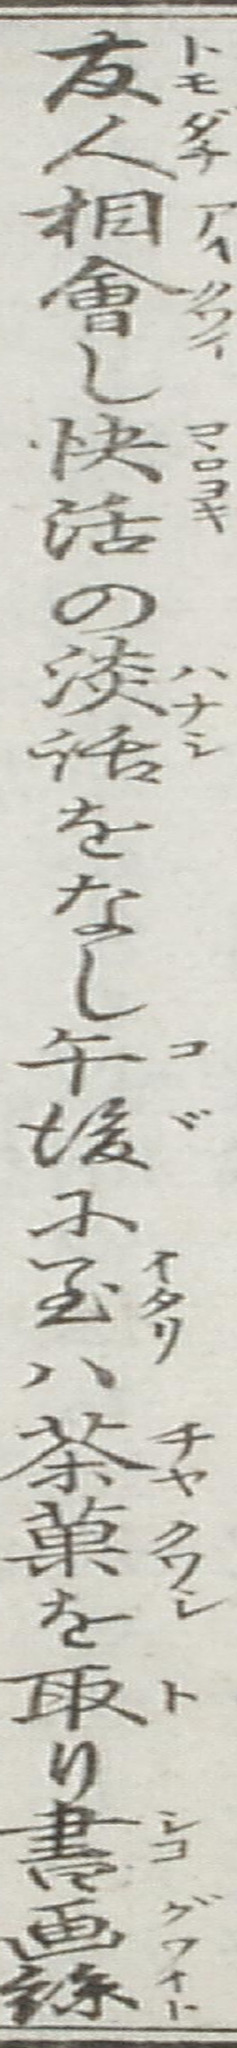友人相会し快活の淡話をなし午後に至りは茶菓を取り書画絲
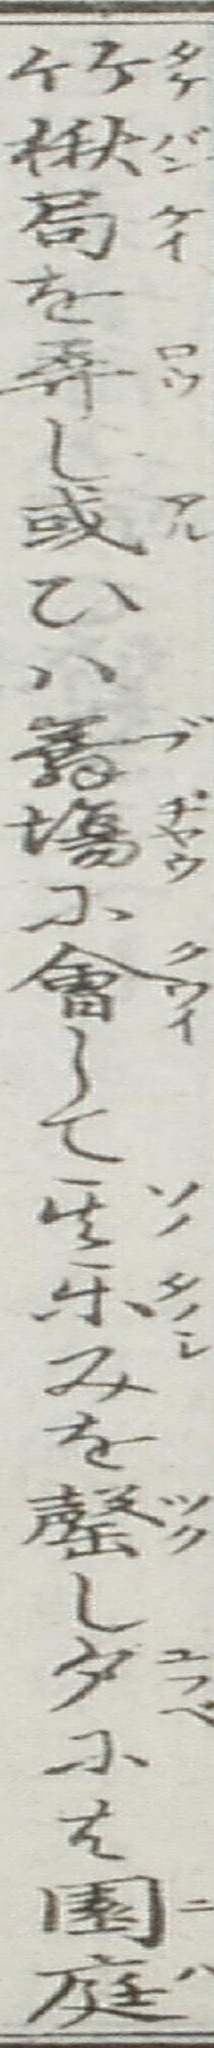竹？局を弄し或ひは舞場に会して其楽みを？し夕には園庭
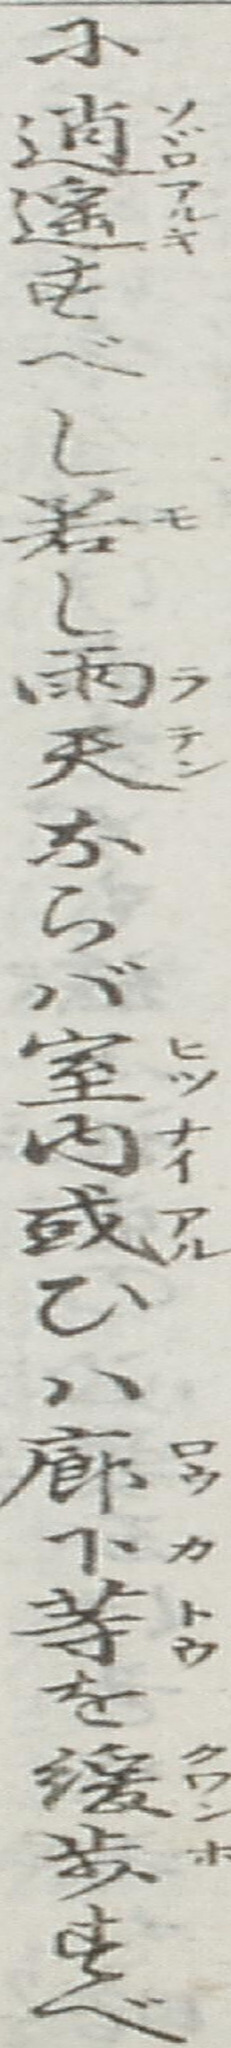に逍遥すべし若し雨天ならば室内或ひは廊下等を緩歩すべ
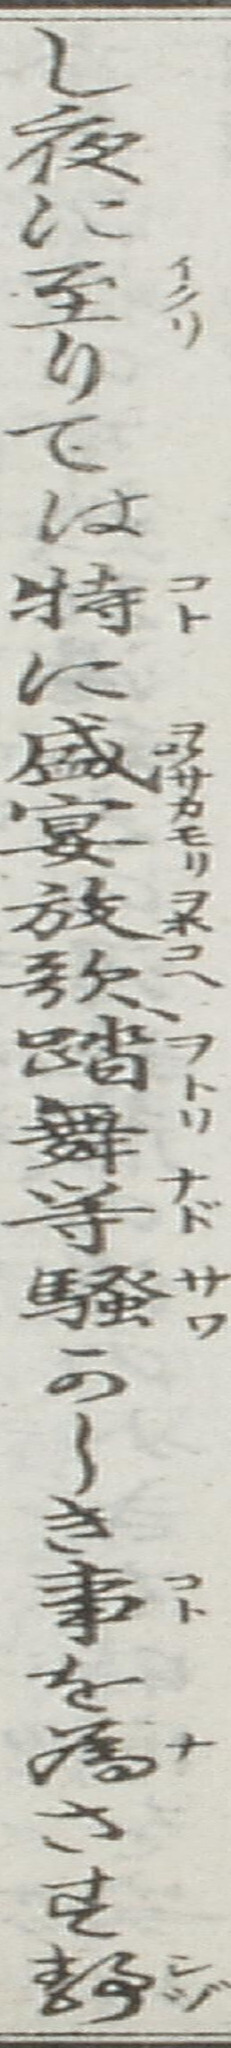し夜に至りては特に盛宴放歌、踏舞等騒かしき事を為さす静
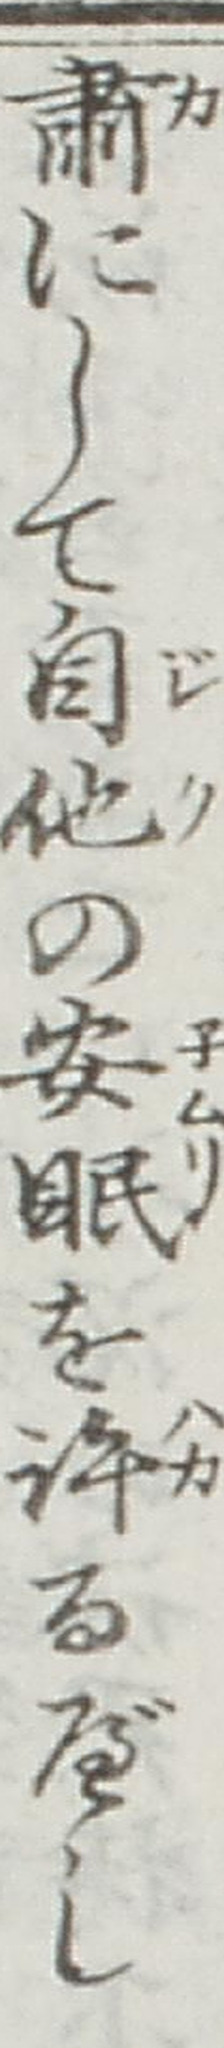粛にして自他の安眠を許るべし
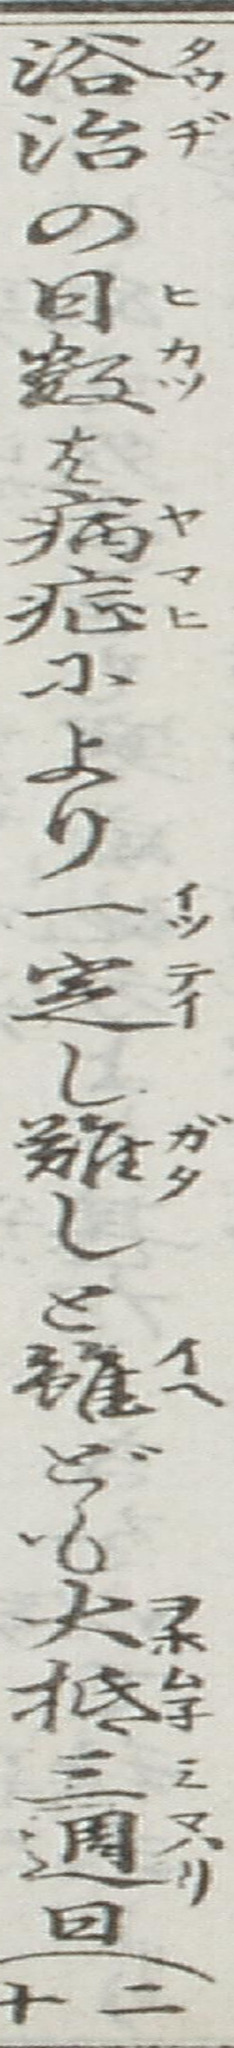浴治の日数は病症により一定し難しと雖ども大抵三週日二十
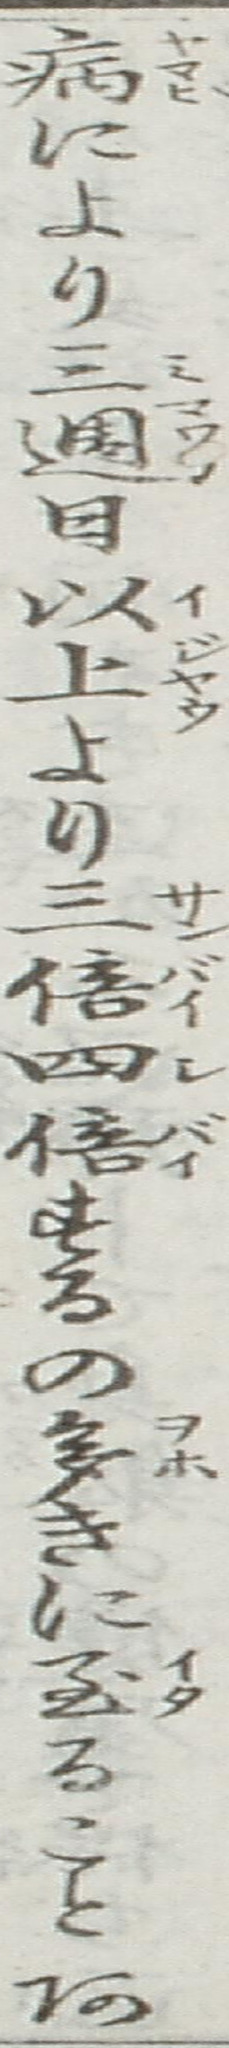病により三週目以上より三倍四倍するの多きに至ることあ
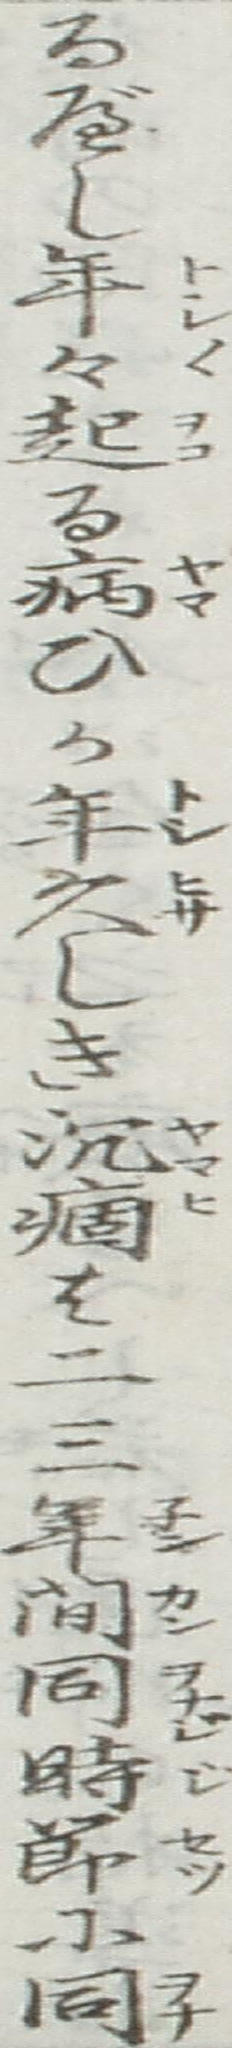るべし年々起る病ひか年久しき？痼は二三年間同時節に同
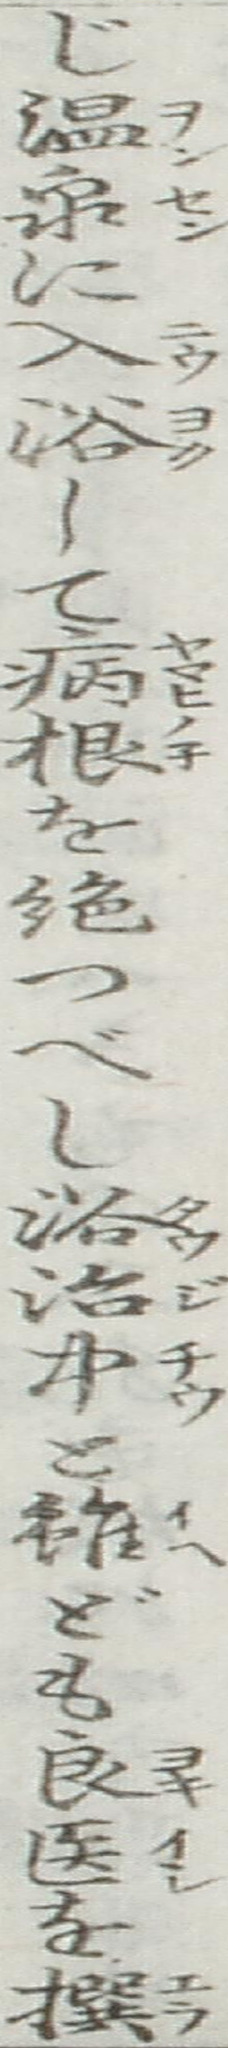じ温泉に入浴して病根を絶つべし浴治中と雖ども良医を撰
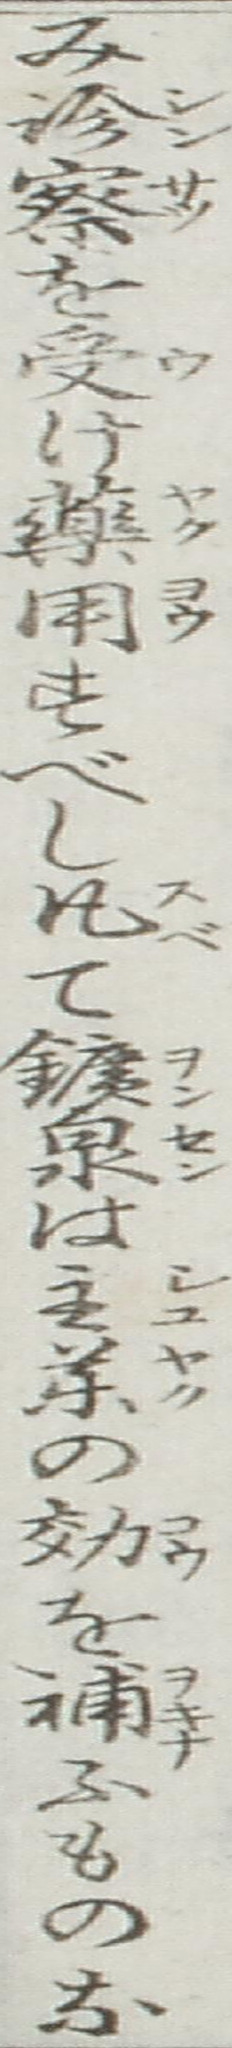み診察を受け薬用すべし凡て鉱泉は主薬の効を補ふものな

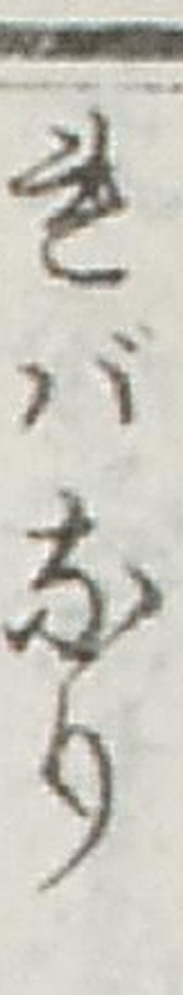ればなり
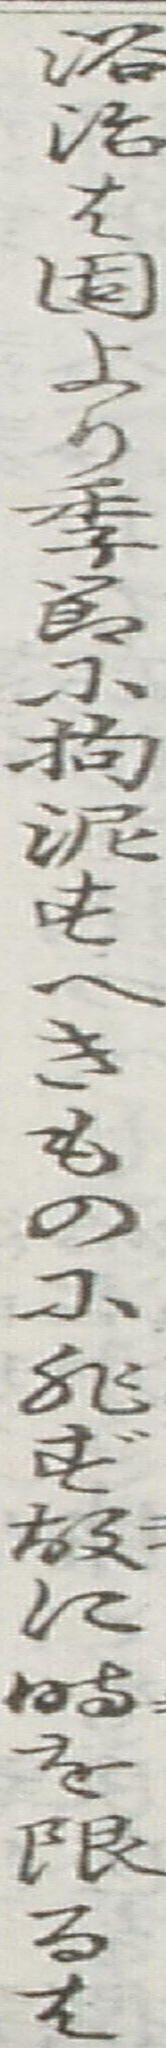浴治は固より季節に拘泥すへきものに非ず故に時を限るは
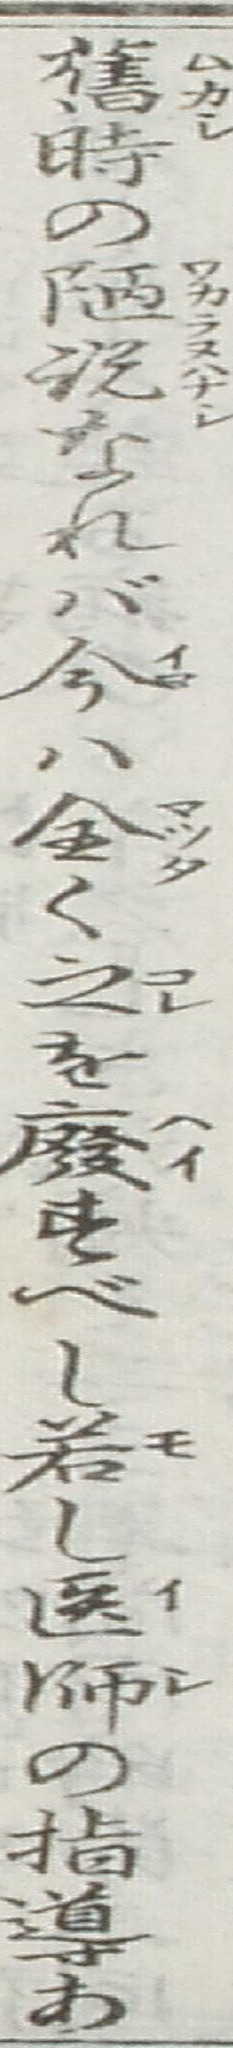旧時の陋説なれば今は金く之を廃すべし若し医師の指導あ
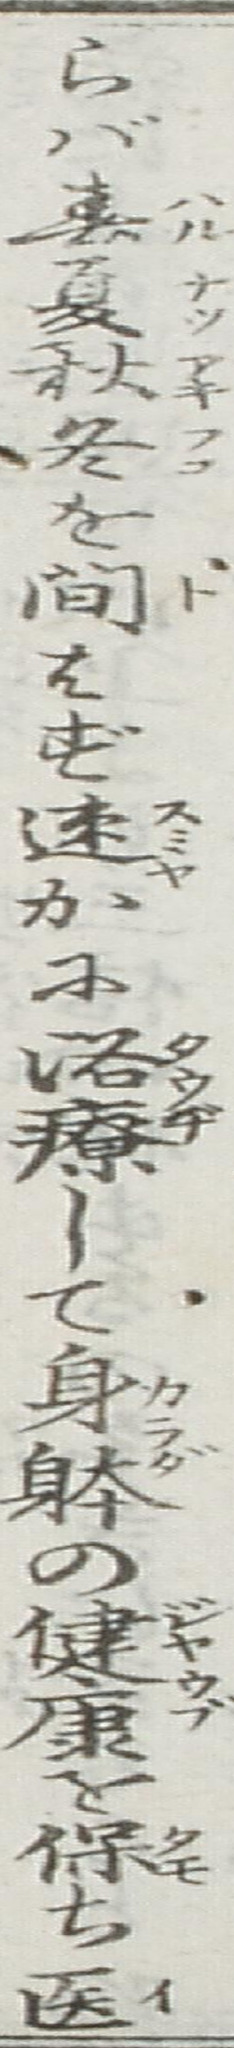らば春夏秋冬を間はず速かに浴療して身体の健康と保ち医
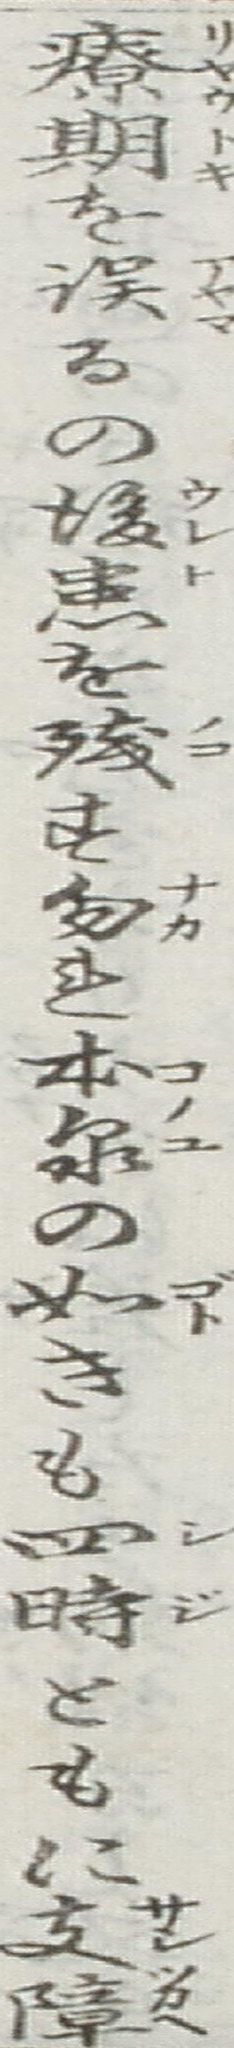療期を誤るの後患を残す勿れ本泉の如きも四時ともに支障
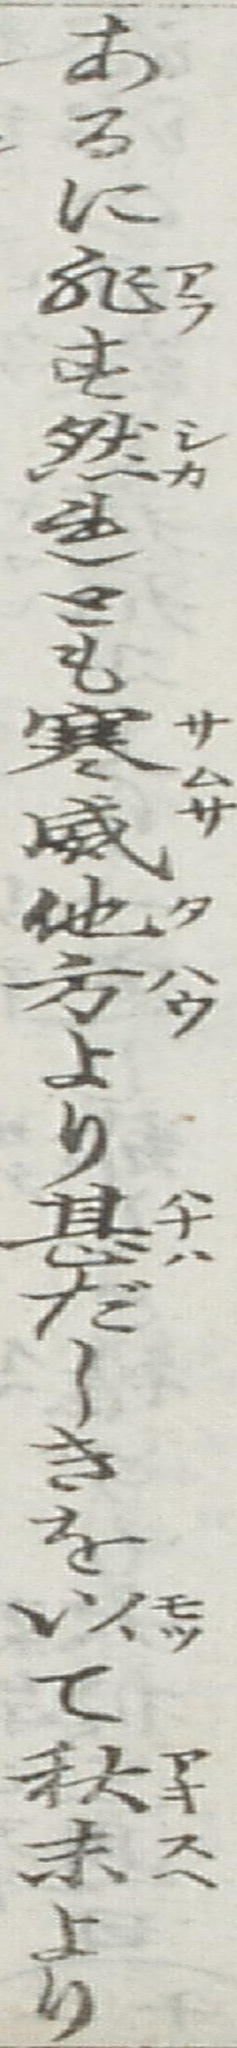あるに非す然れとも寒威他方より甚だしきを以て秋未より
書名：草津温泉誌　全
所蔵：東京大学地震研究所図書室 Earthquake Research Institute Library, The University of Tokyo, JAPAN
